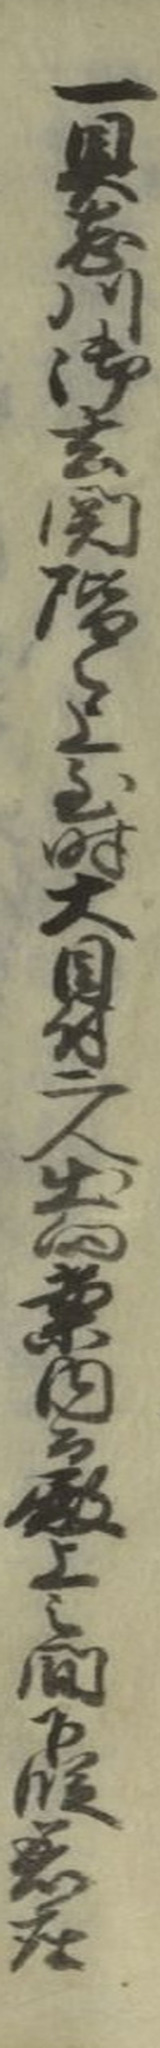一具志川御玄関階之上至時大目付二人出向案内而殿上之間下段着座
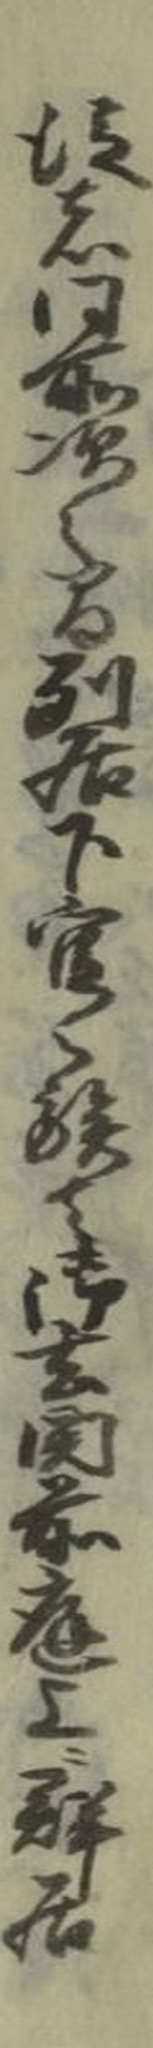従者同所次之間列居下官之族は御玄関前庭上に群居
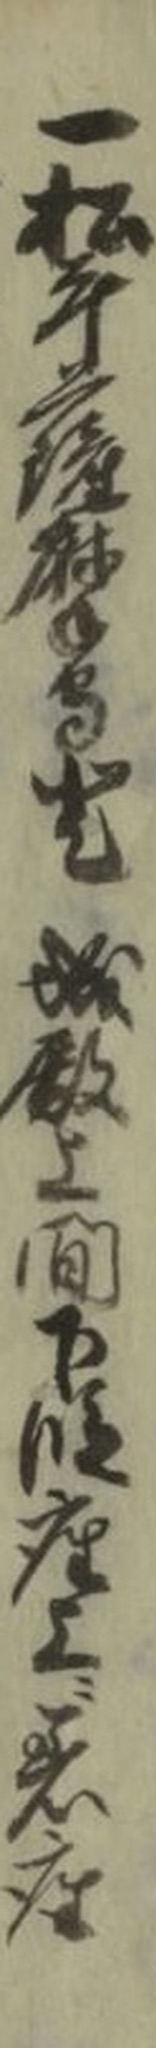一松平薩摩守登城殿上間下段座上に着座
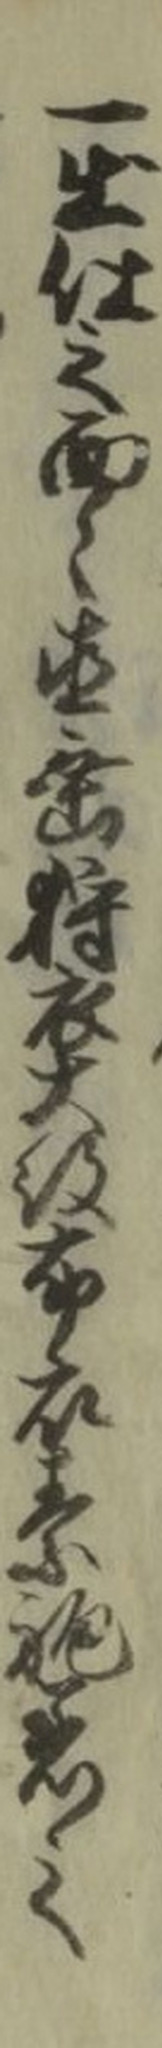一出仕之面々直垂狩衣大紋布衣素袍着之
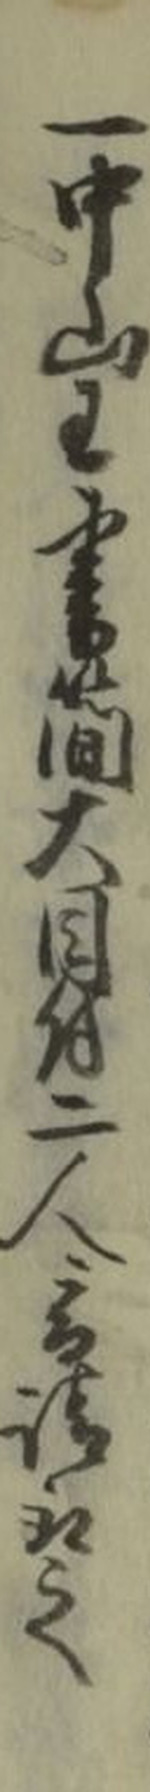一中山王書簡大目付二人に而請取之
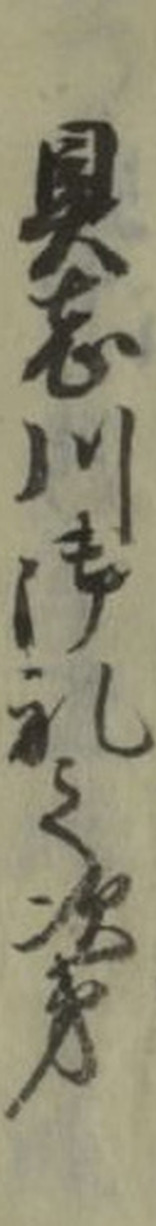具志川御礼之次第

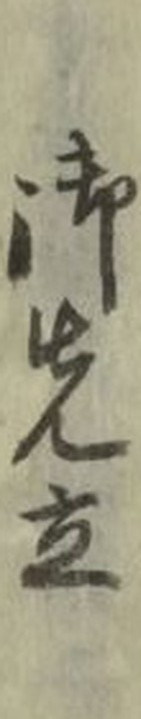御先立
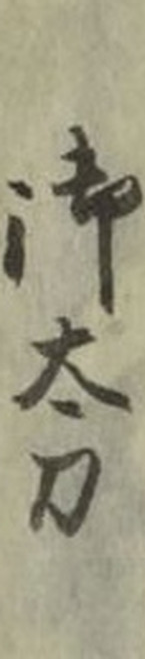御太刀
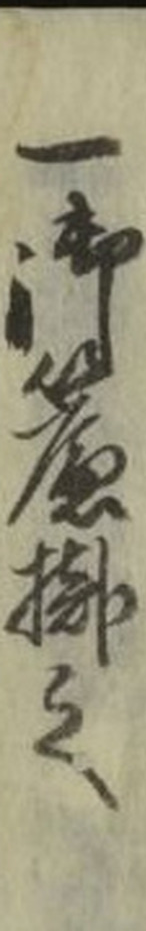一御簾掛之
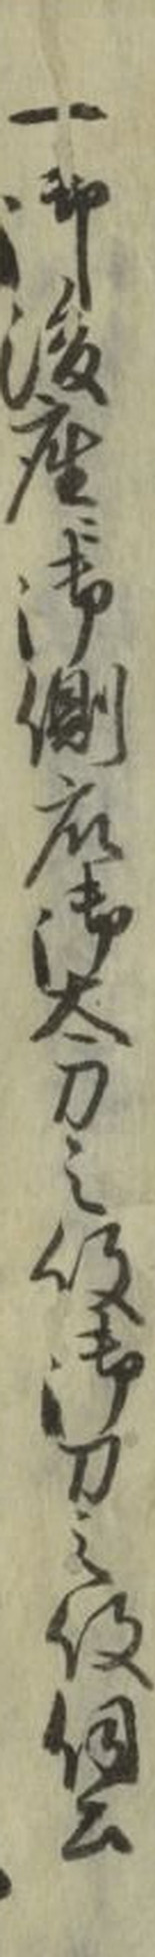一御後座に御側衆御太刀之役御刀之役伺公
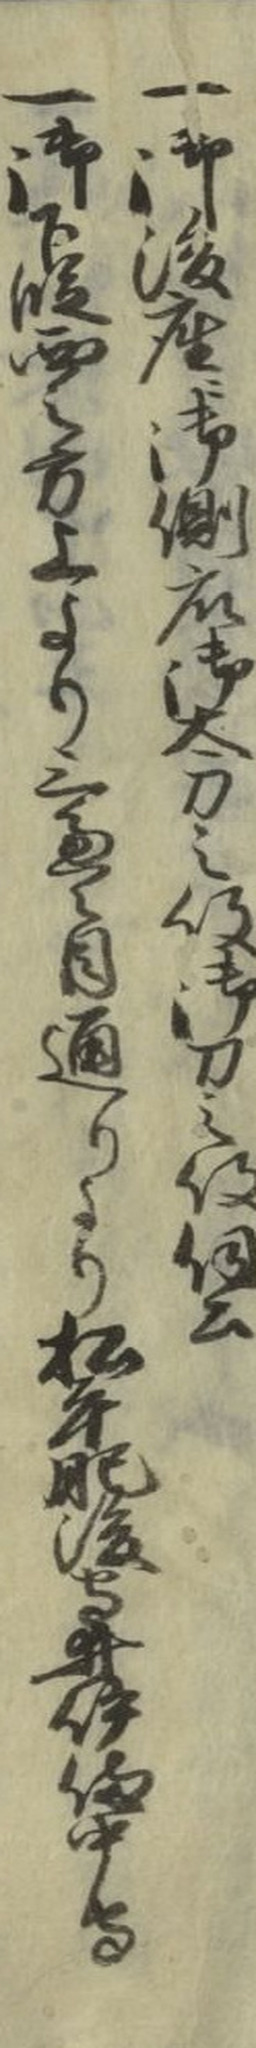一御下段西之方上より三畳目通りより松平肥後守井伊備中守
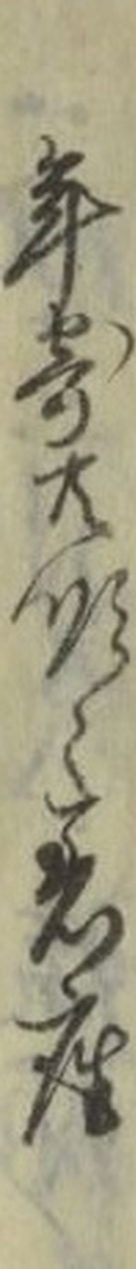年寄共順々着座
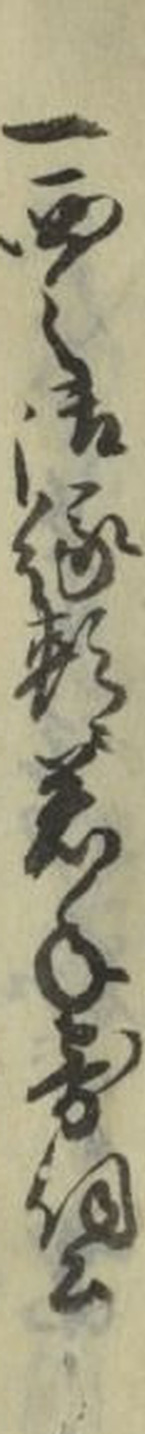一西之御縁軒に若年寄伺公
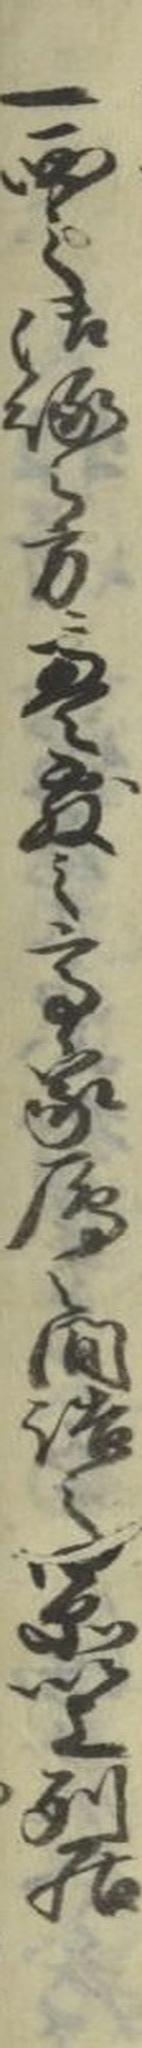一西之御縁之方に畳敷之高家雁之間詰之四品以上列居
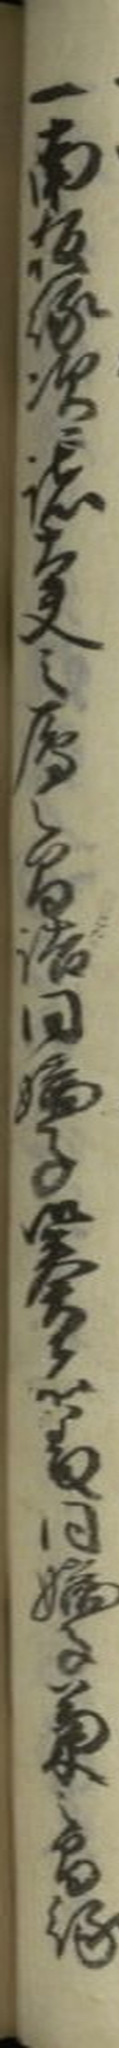一南板縁次に諸大夫之雁之間詰同嫡子御奏者番同嫡子菊之間縁
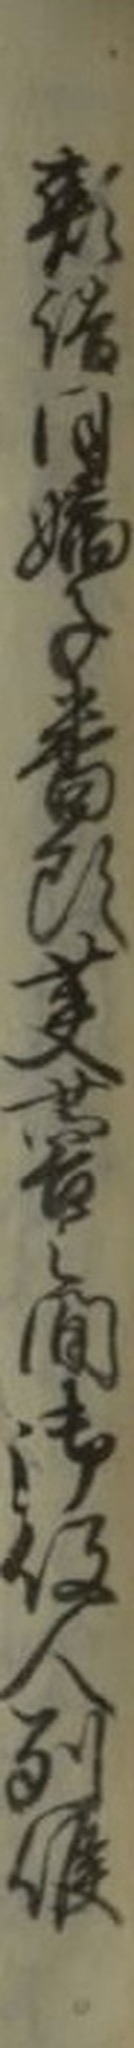頬詰同嫡子番頭芙蓉之間御役人列候
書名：琉球人来朝之記
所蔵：University of the Ryukyus Library
